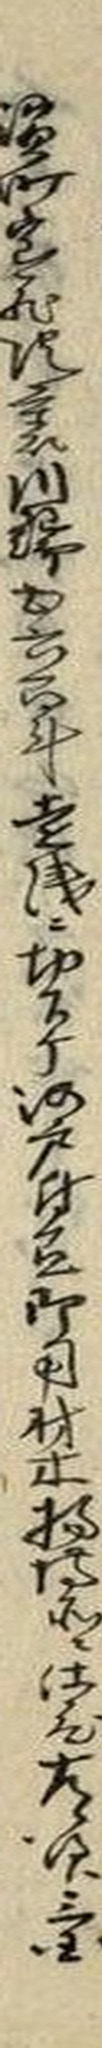浜町宝蔵院裏川端五六間斗遠浅に切下ケ河戸付置御用材木揚場所に仕度左候得は三国
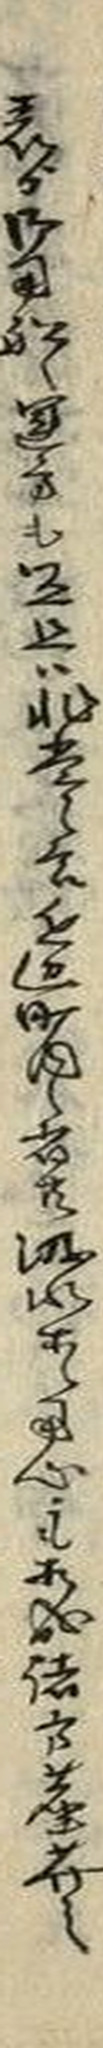表ゟ御用船之運方も宜且は非常之節近辺町内之者共汲水等之用心にも相成諸方塵芥之
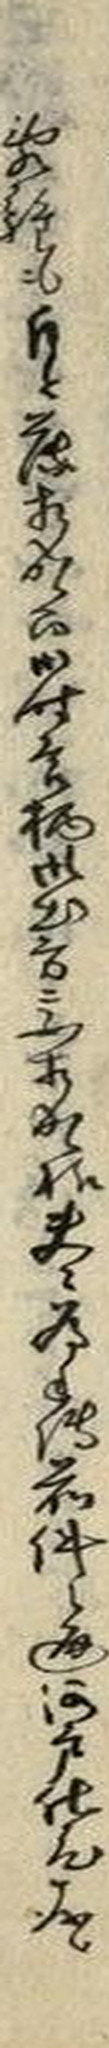乱雑も自と薄相成候間御時節柄御出方に不相成候様夫々為手伝前件之通河戸仕度奉存候
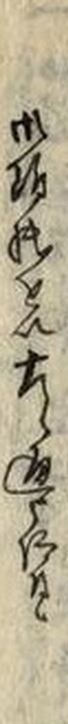御附紙を以左之通被仰付候
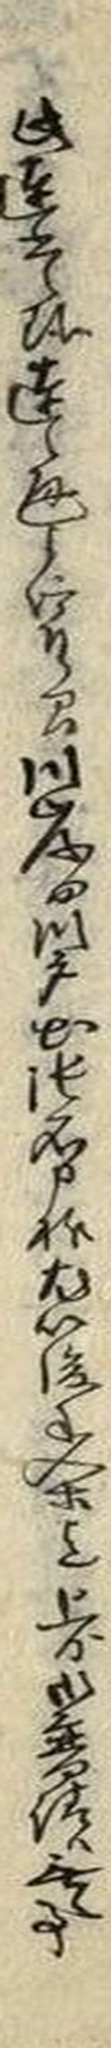此達書之趣達之通被仰付候間川岸ゟ川戸出張不申様尤以後手入等迄上ゟ御普請は無之事
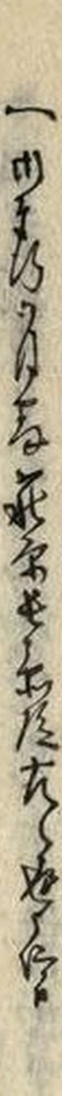一御奉行御月番萩原長兵衛殿左之通被仰付
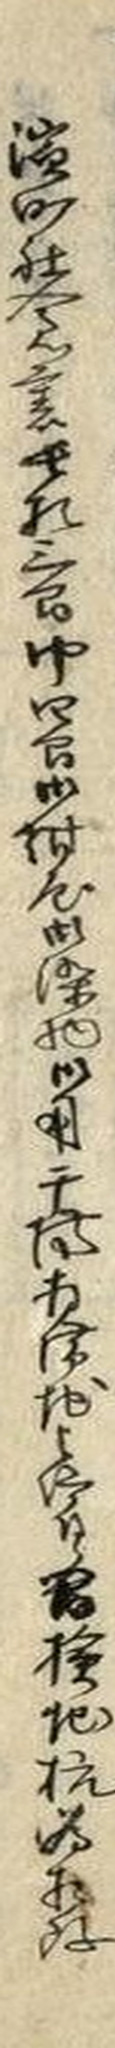浜町社倉裏長拾三間巾四間御紺屋御染物御用干場拝借地被仰付候間検地杭為相改
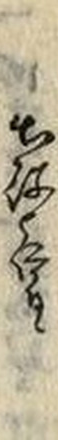出役被仰付候
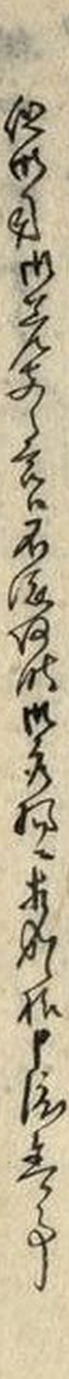但御用御差支之節は不依何時御取揚に相成候様申渡置候事
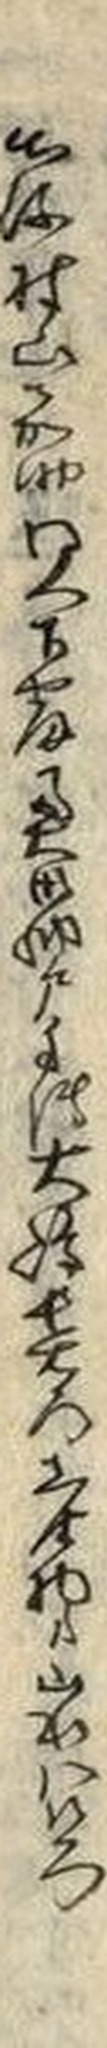出役村山嘉助同人下番奥御納戸手伝大島長右衛門産物方山本八左衛門
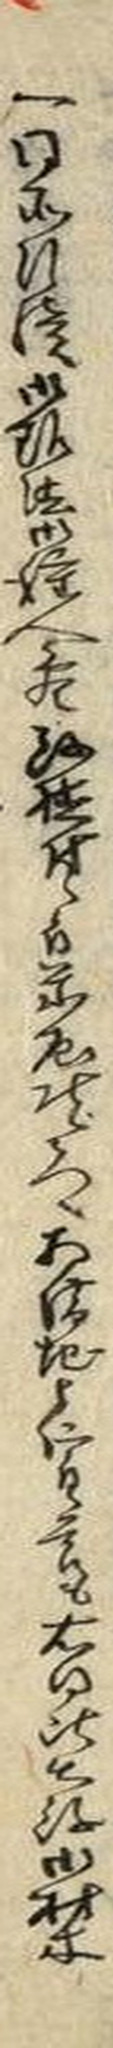一同所引続御趣法御種人参致植付候に付米屋次郎右衛門へ拝借地被仰付候節も右同断出役御材木

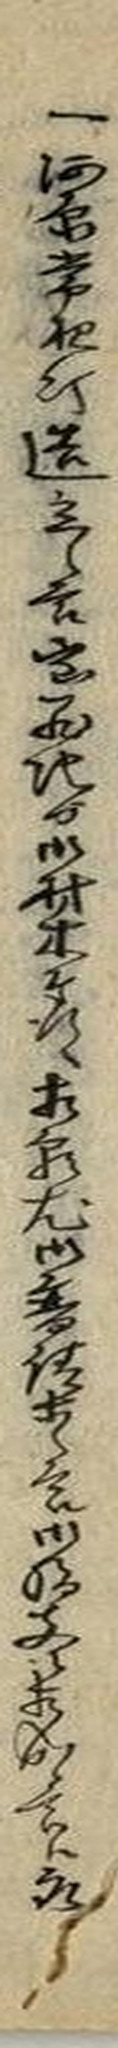一河原常夜灯造立之節宝蔵院ゟ御材木奉行へ相願尤御普請等之節御指支に相成候節は取
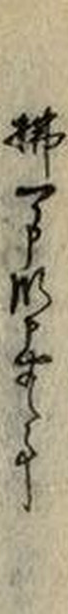払可申段申聞候事
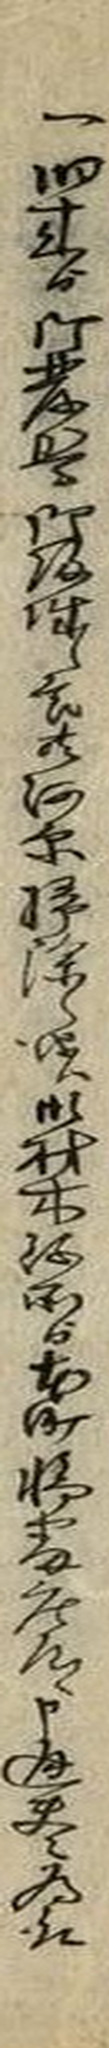一旧来ゟ御発駕御帰城之節共河原掃除之儀は御材木役所ゟ本町輪番庄屋へ申通夫々為取
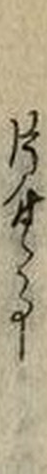片付候事
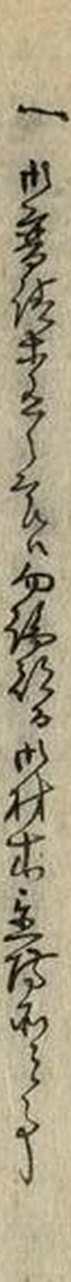一御普請等有之節は勿論都て御材木置場所に候事
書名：御城下諸事之部
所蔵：福井県文書館 Fukui Prefectural Archives
